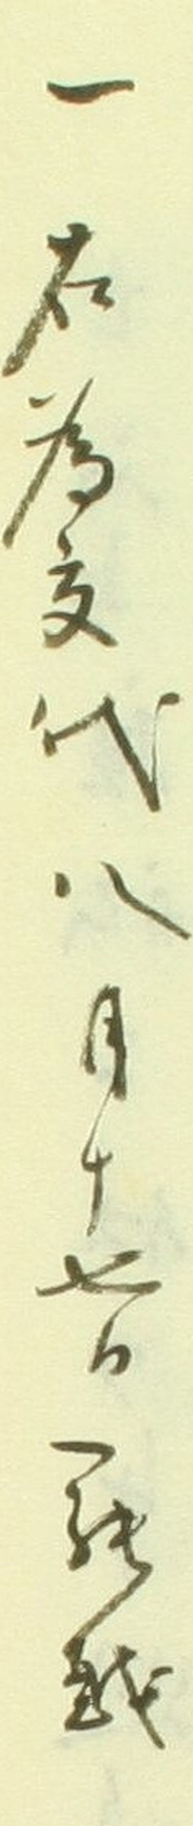一右為交代八月十七日罷越
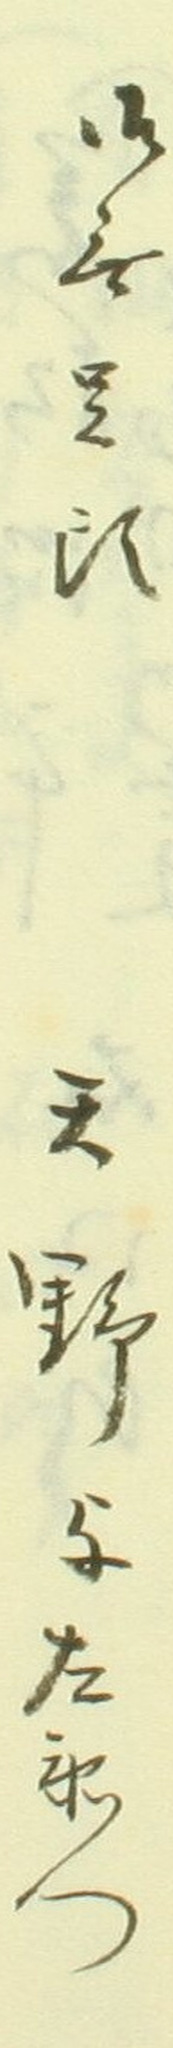御無足頭天野与左衛門

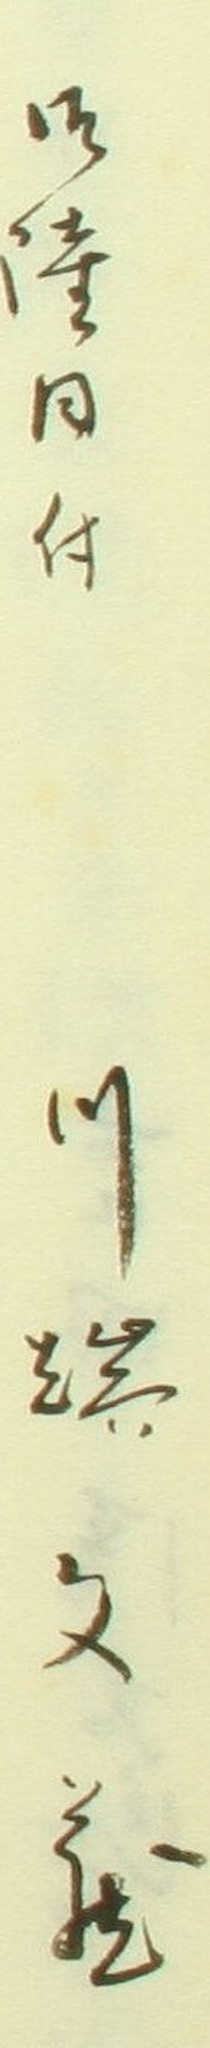御徒目付川端文蔵
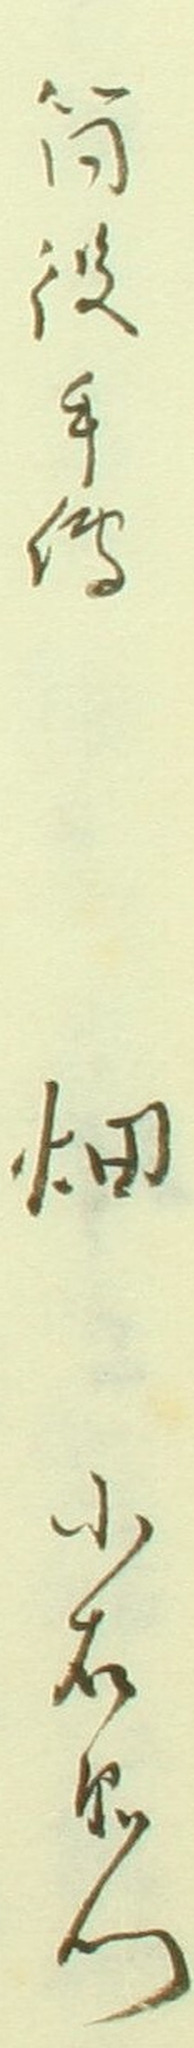筒役手伝畑小右衛門
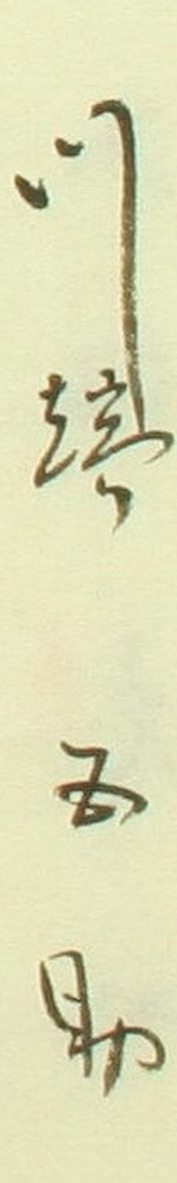川端五助
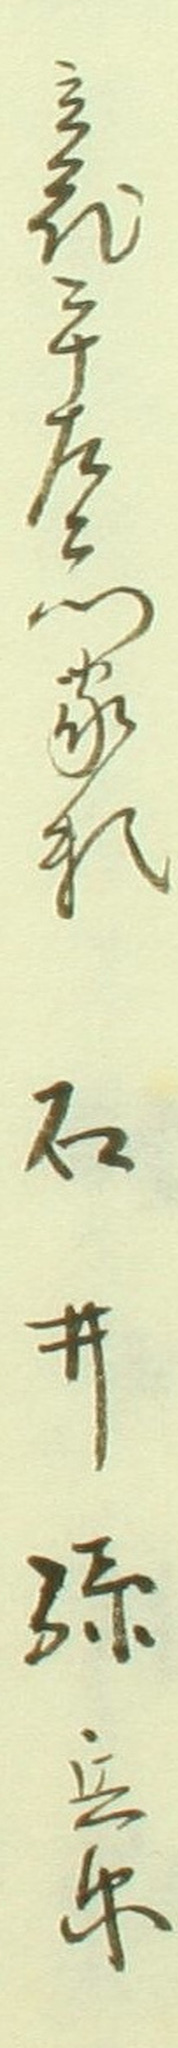立花平左衛門家来石井弥兵衛
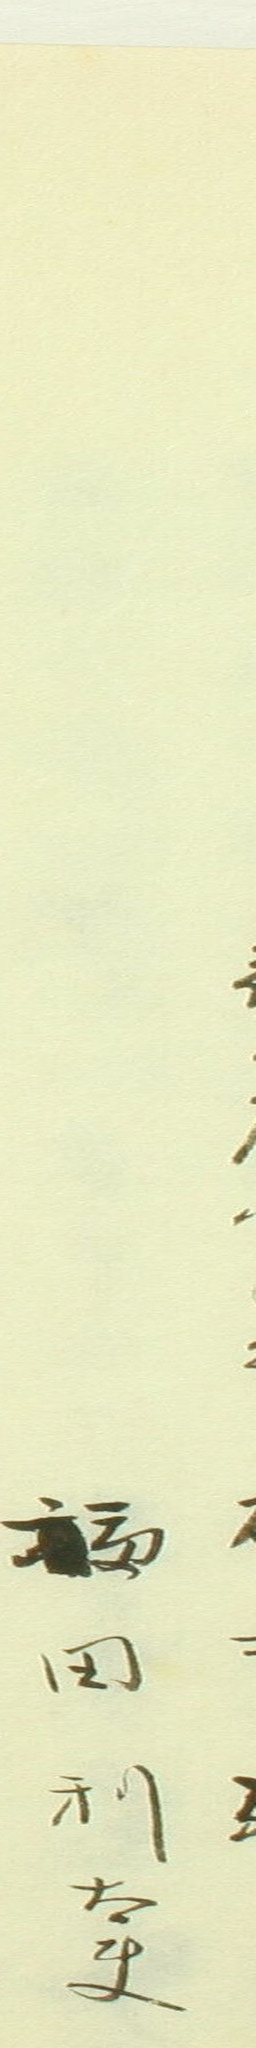福田利太夫
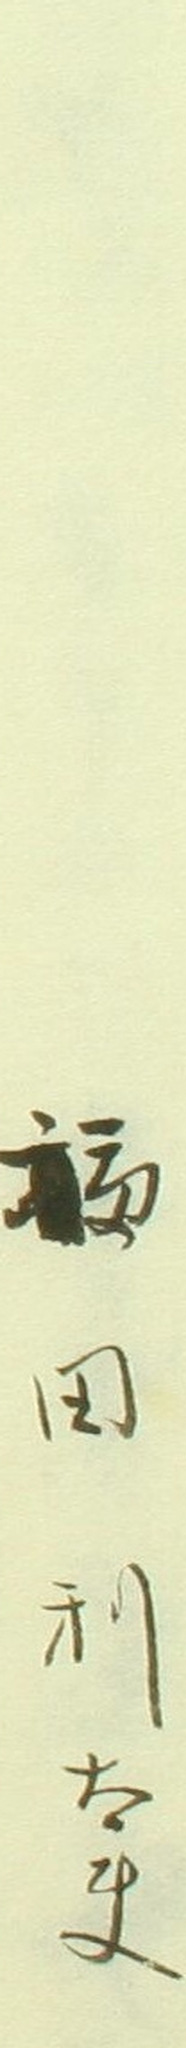福田利太夫
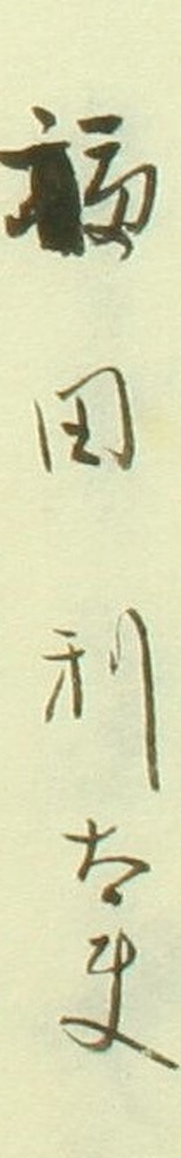福田利太夫
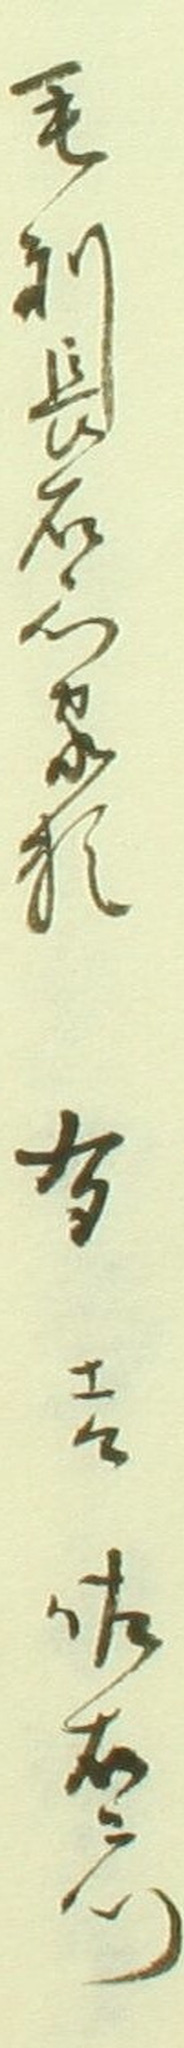毛利長右衛門家来有吉佐右衛門
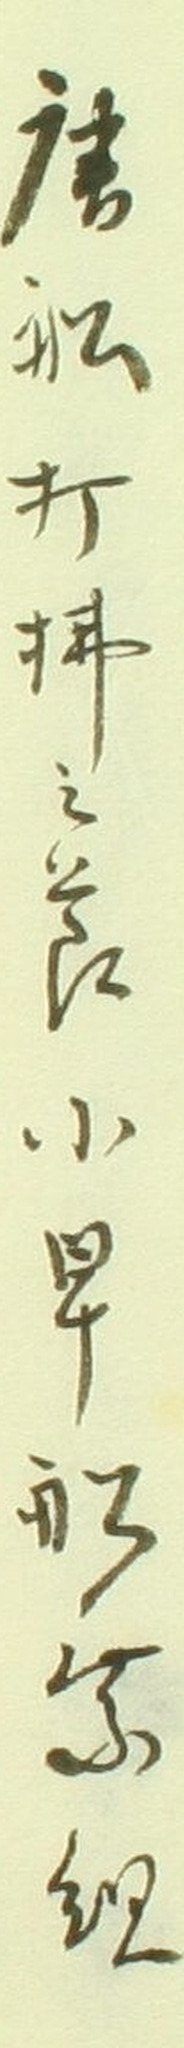唐船打払之節小早船乗組
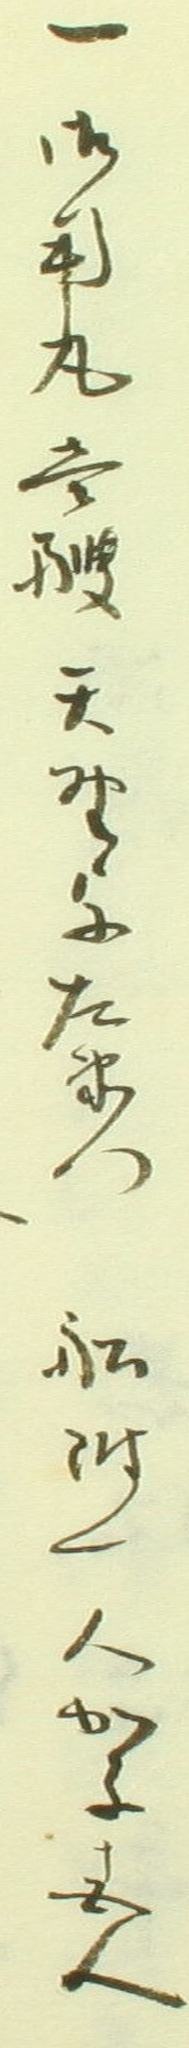一御用丸壱艘天野千左衛門船付一人加子十五人
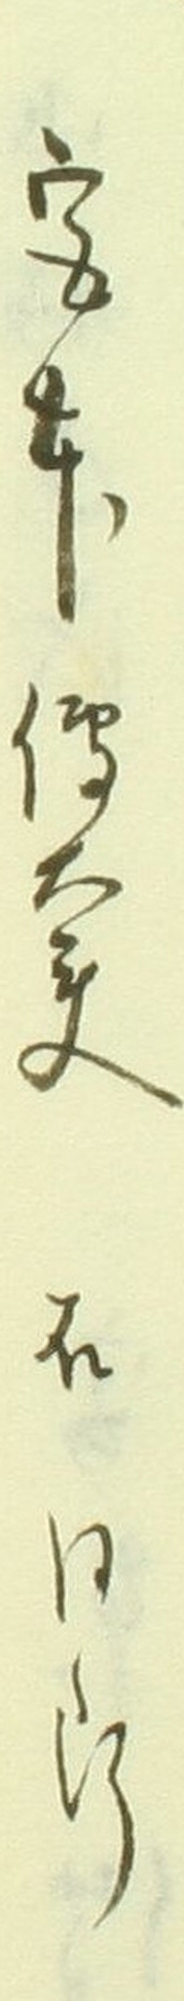一同宮本伝太夫右同断
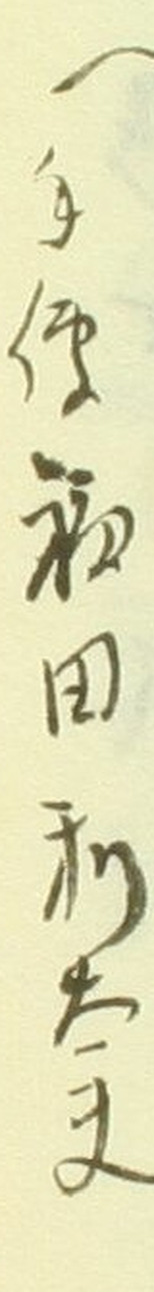手伝福田利太夫
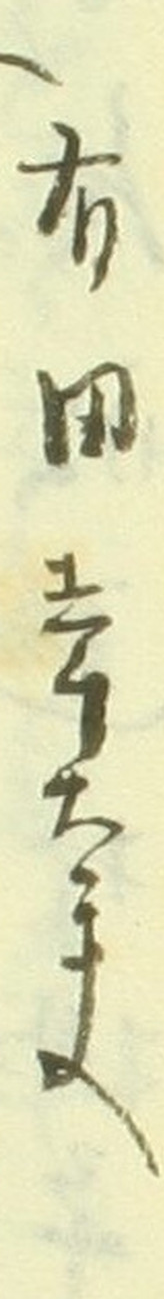福田利太夫
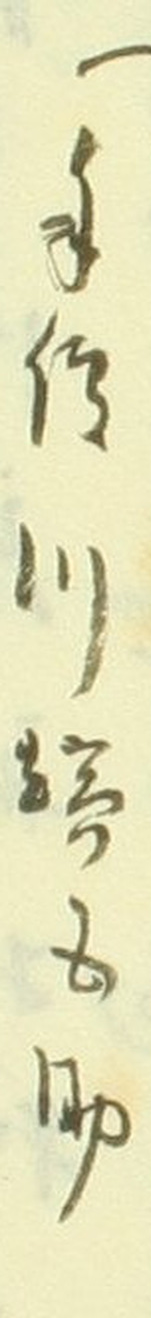手伝川端五助
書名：唐船漂流記 三
